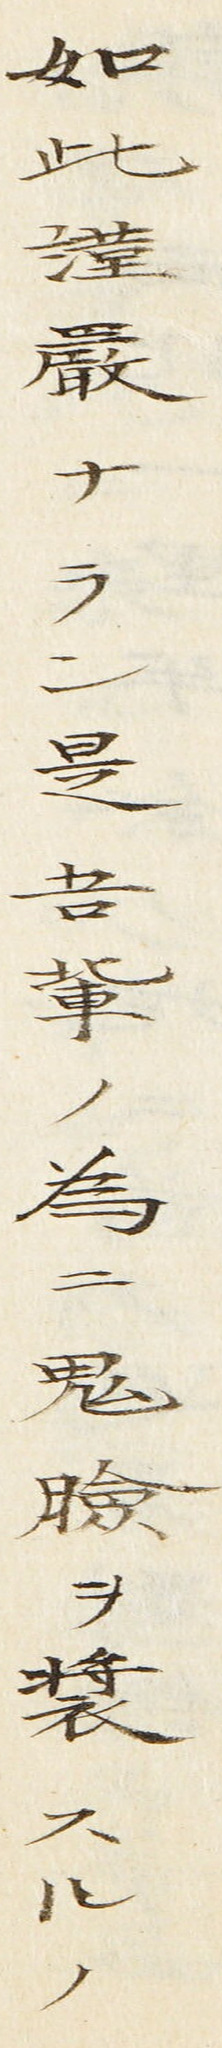如此謹厳ナラン是吾輩ノ為ニ鬼瞼ヲ𫌏スルノ
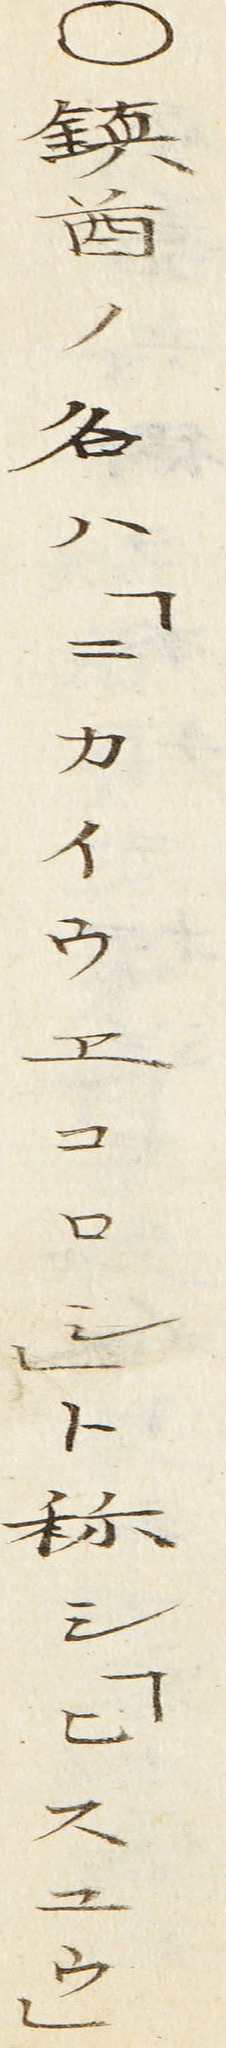○鎮酋ノ名ハ「ニカイウヱコロシ」ト称シ「ヒスユウ」
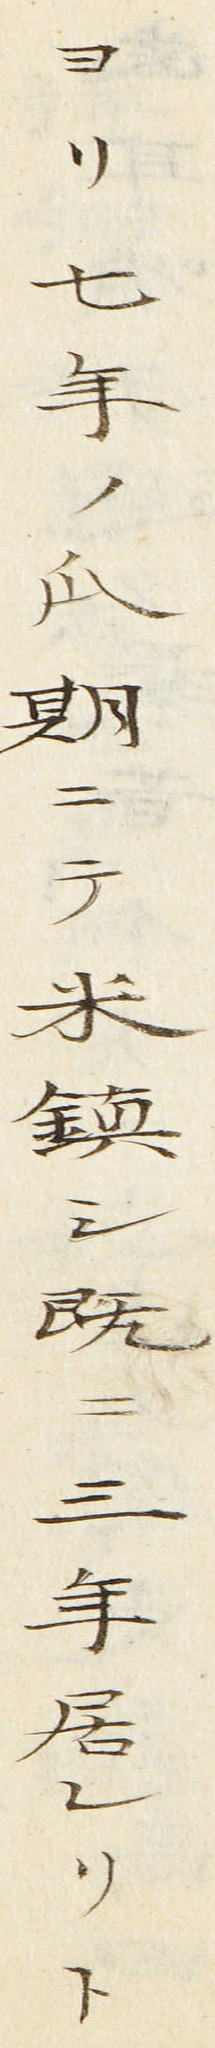ヨリ七年ノ爪期ニテ米鎮シ既ニ三年居レリト
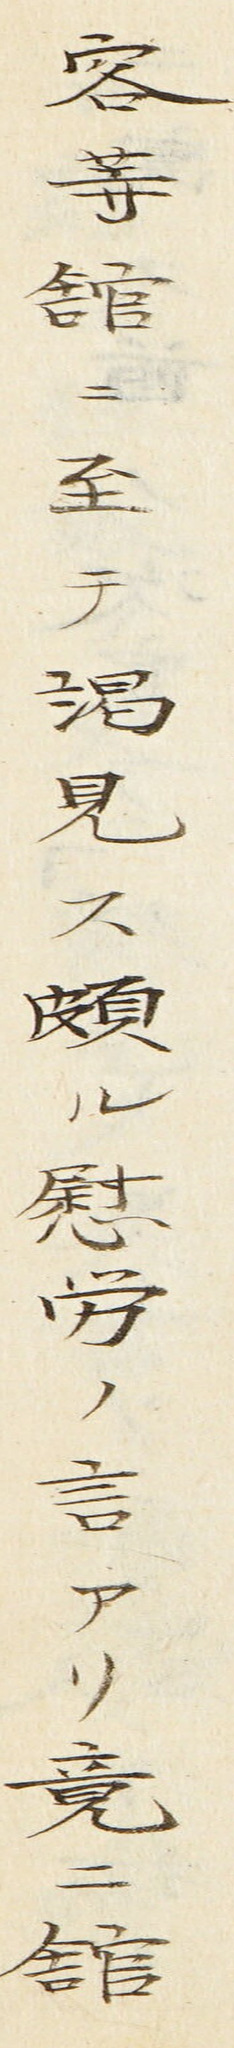客等館ニ至テ謁見ス頗ル慰労ノ言アリ竟ニ館

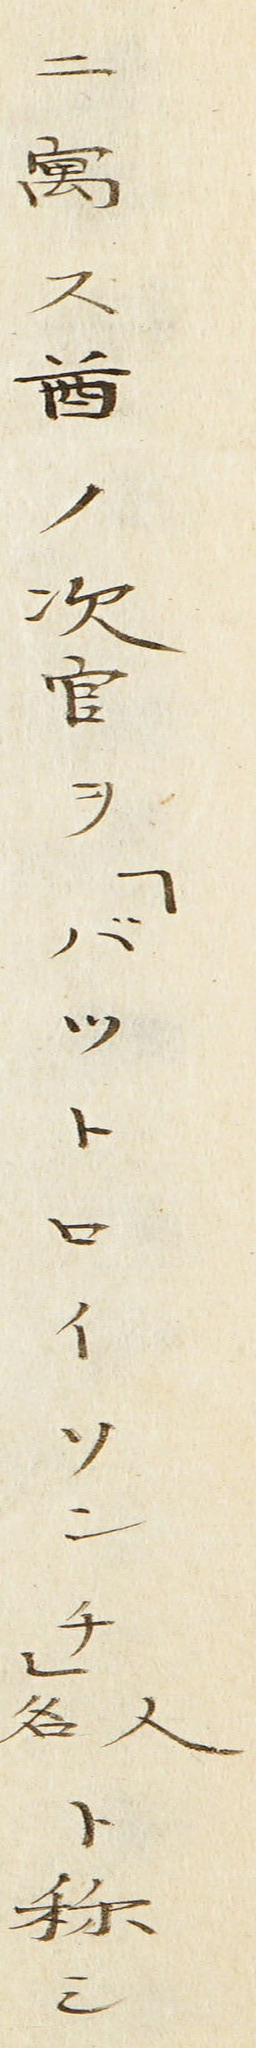ニ寓ス酋ノ次官ヲ「バツトロイソンチ」人名ト称シ
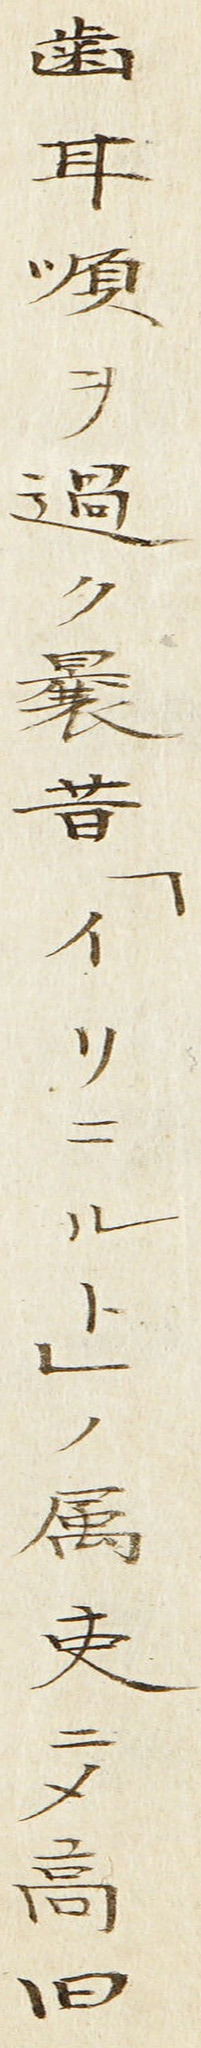歯耳順ヲ過ク曩昔「イリニルト」ノ属吏ニシテ高旧
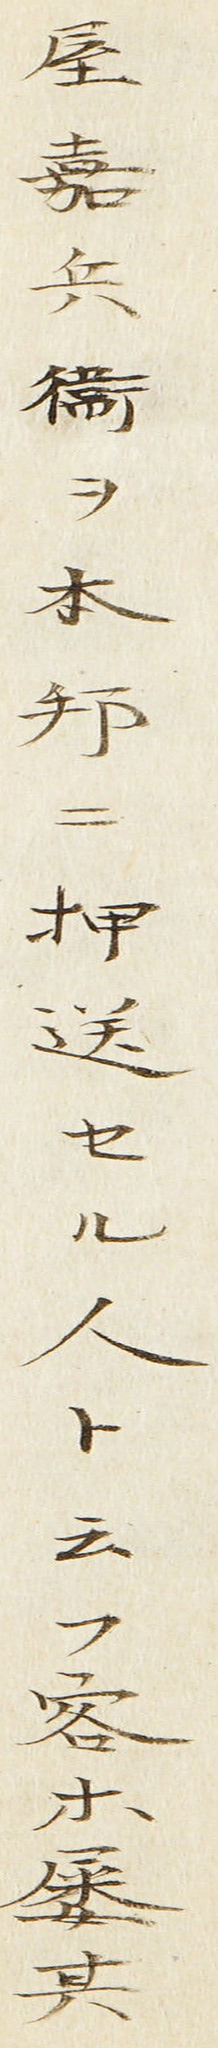屋嘉兵衛ヲ本邦ニ押送セル人ト云フ客等屡其
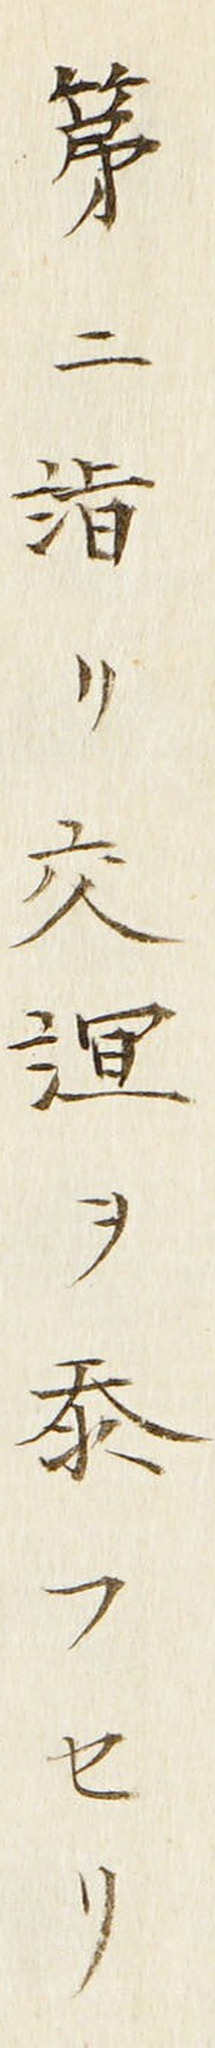第ニ詣リ交誼ヲ沗フセリ
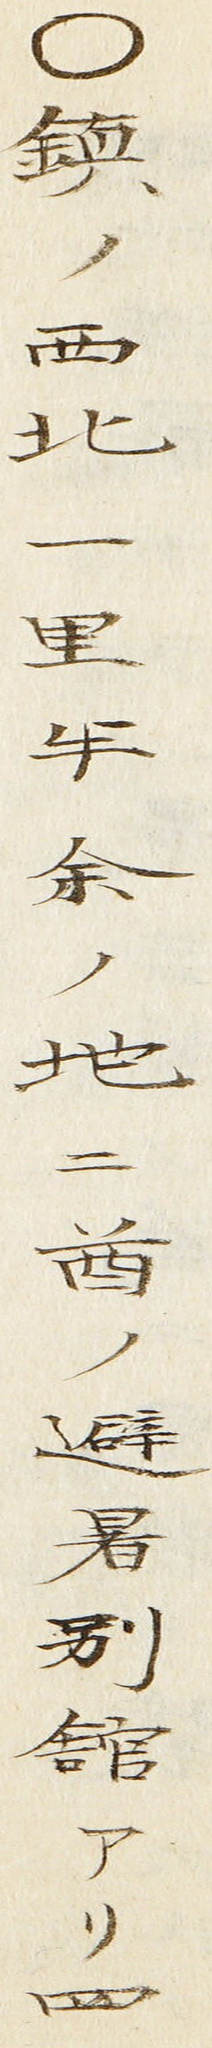○鎮ノ西北一里半余ノ地ニ酋ノ避暑別館アリ四
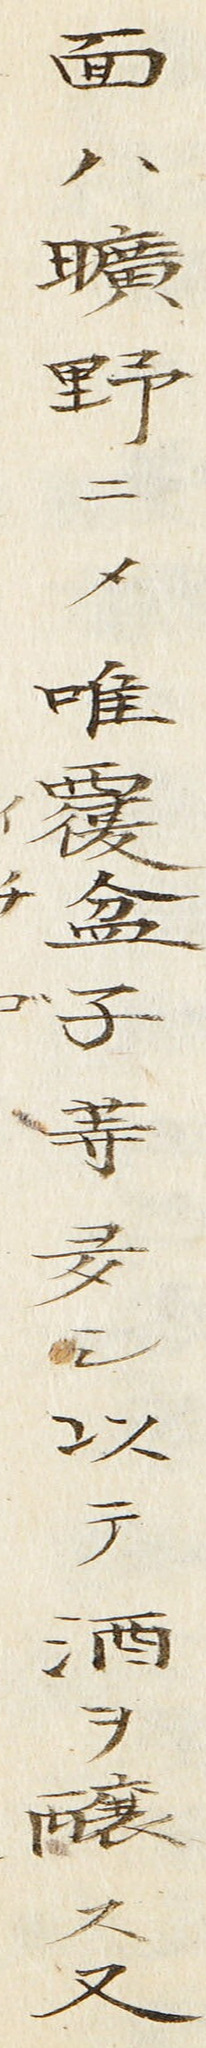面ハ曠野ニシテ唯覆盆子等多シ以テ酒ヲ醸ス又
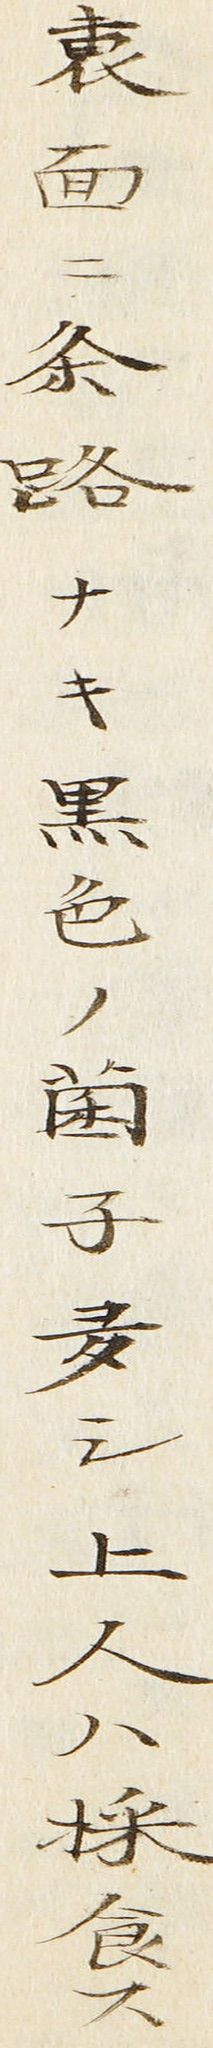裏面ニ条路ナキ黒色ノ菌子多シ上人ハ採食ス
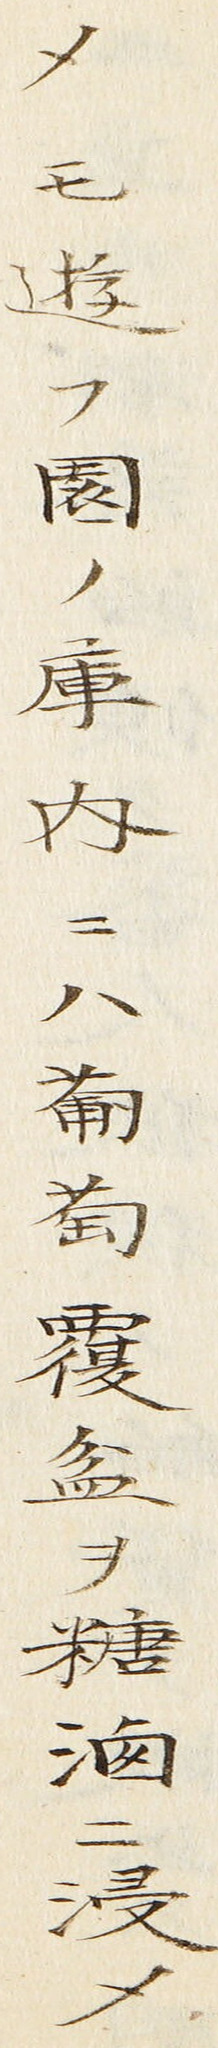シテモ遊フ園ノ庫内ニハ葡萄覆盆ヲ糖滷ニ浸シテ
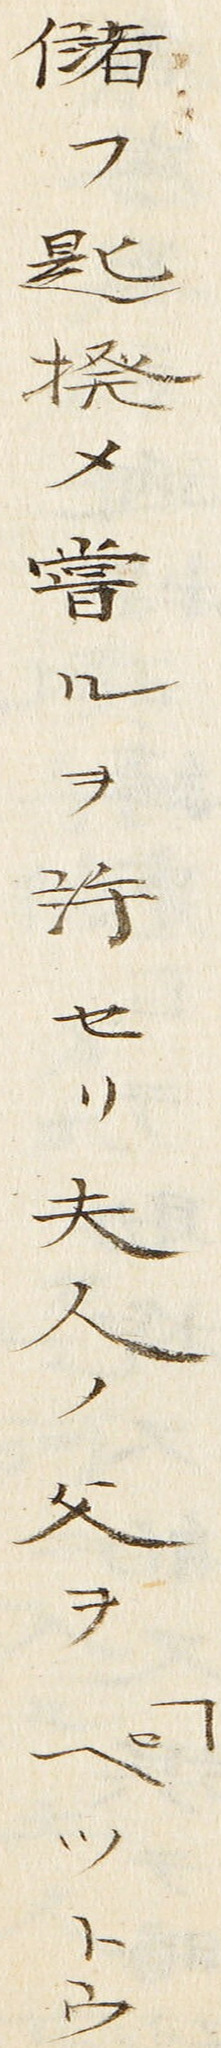儲フ匙揆シテ甞ルヲ許セリ夫人ノ父ヲ「ペツトウ
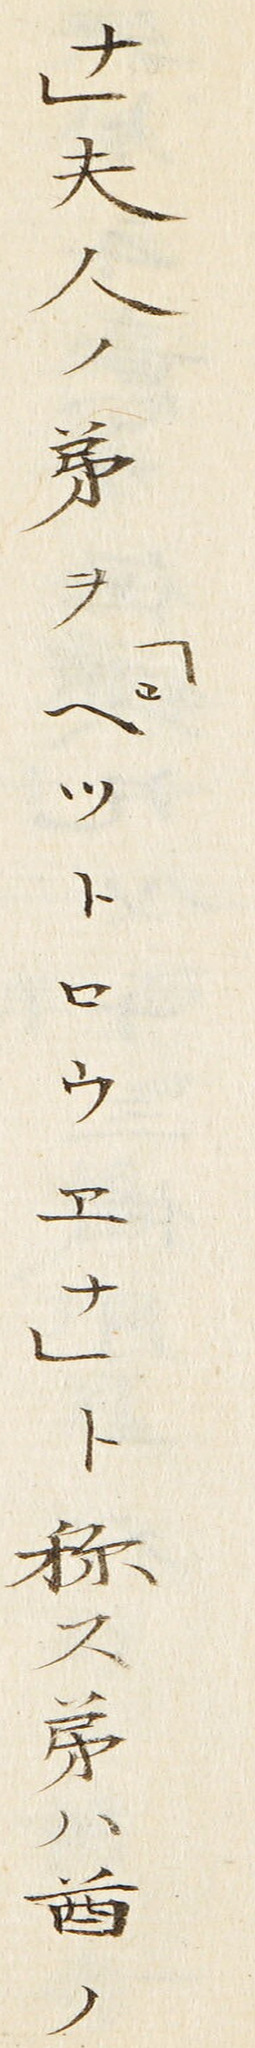ナ」夫人ノ弟ヲ「ペツトロウヱナ」ト称ス弟ハ酋ノ
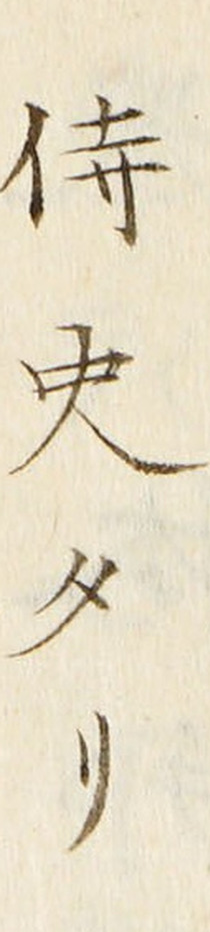侍史タリ
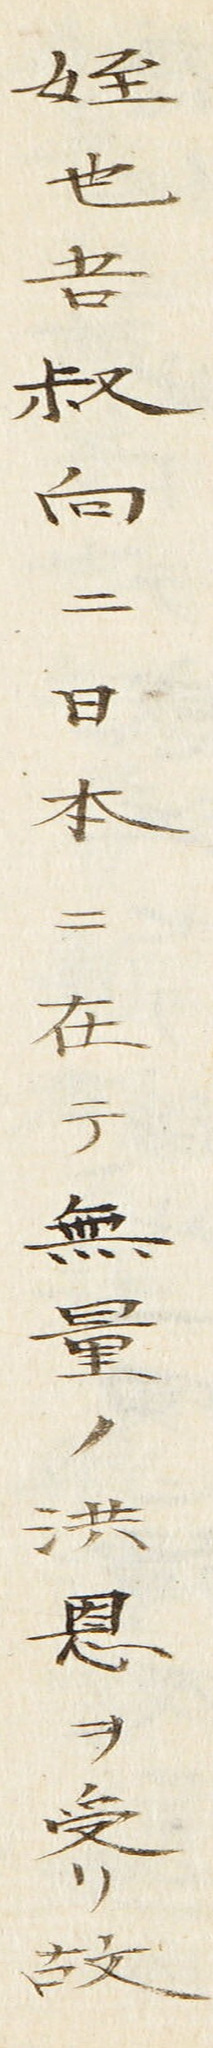姪也吾叔向ニ日本ニ在テ無量ノ洪恩ヲ受リ故
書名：流蕃通書
